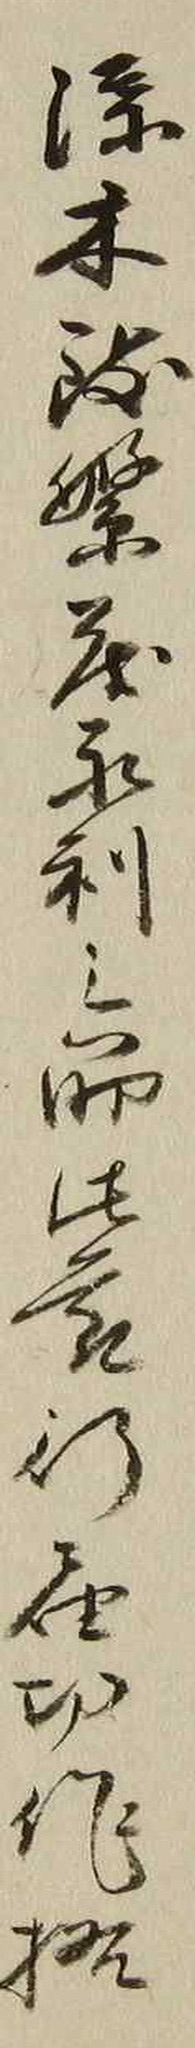添木致繁茂永利之筋此節行届功作格
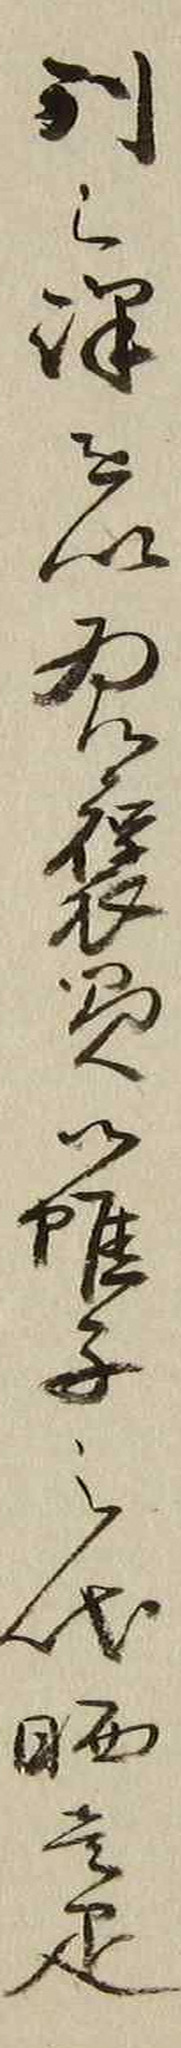別之訳を以為御褒美御帷子之代晒壱疋
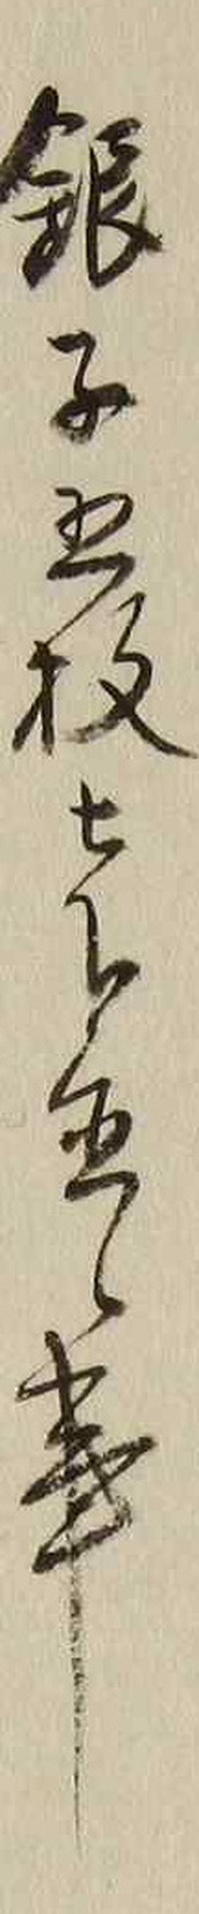銀子五枚被下置候事
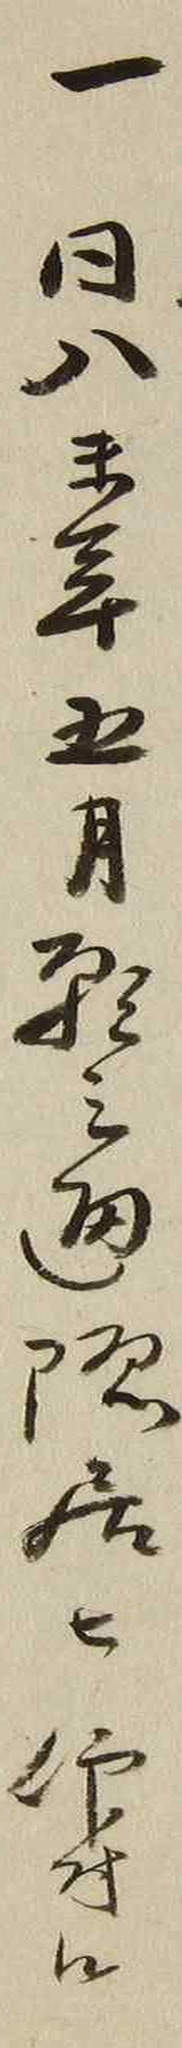一同八未年五月願之通隠居被仰付候
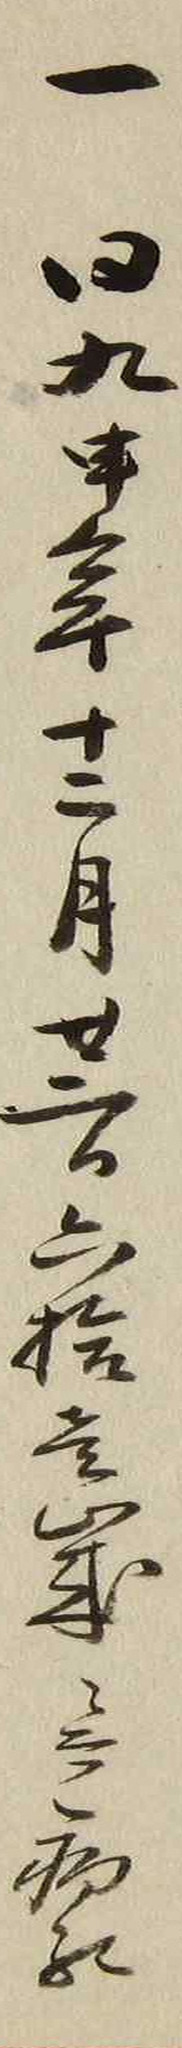一同九申年十二月廿二日六拾壱歳ニ而病死
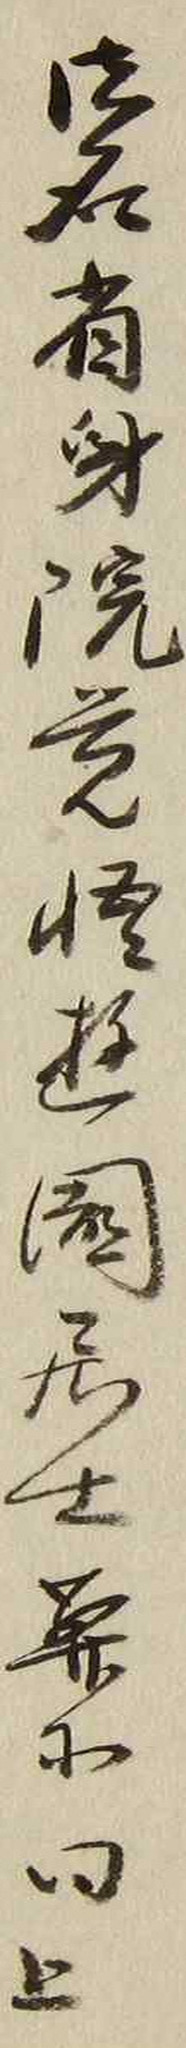法名省身院覚悟遊園居士葬所同上
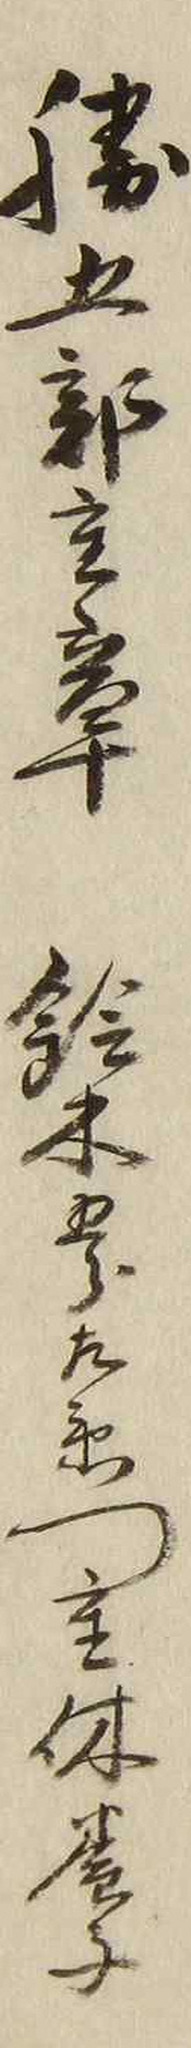勝五郎主章鈴木五郎左衛門重休養子

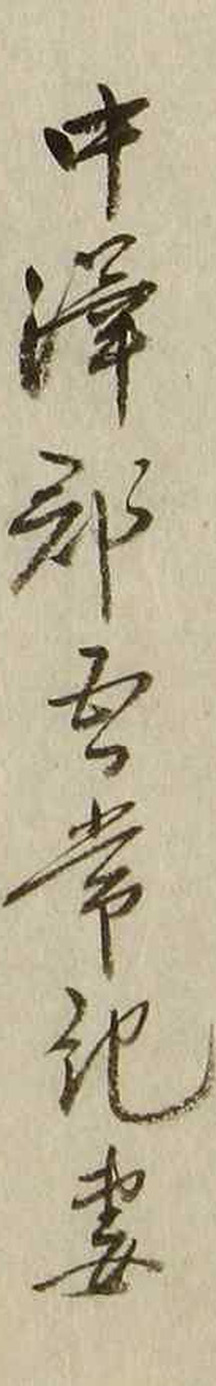中沢郡吾常記妻
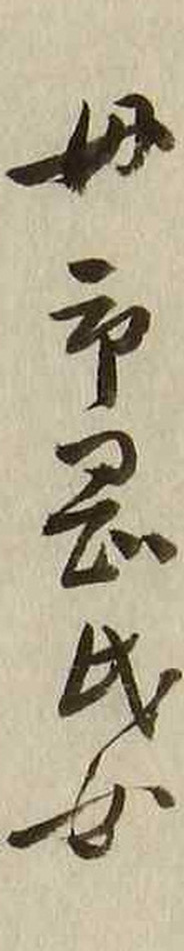母市岡氏女
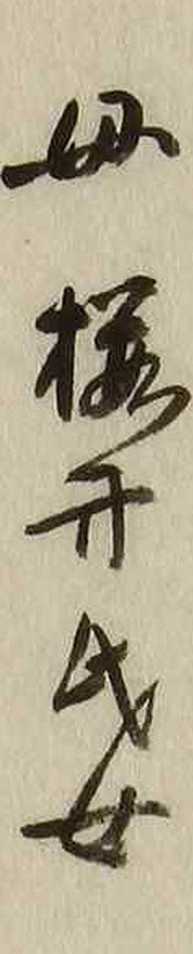母桜井氏女
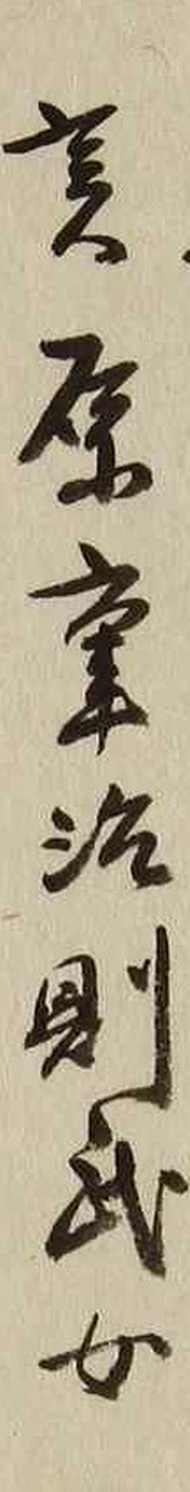実原重治則武女
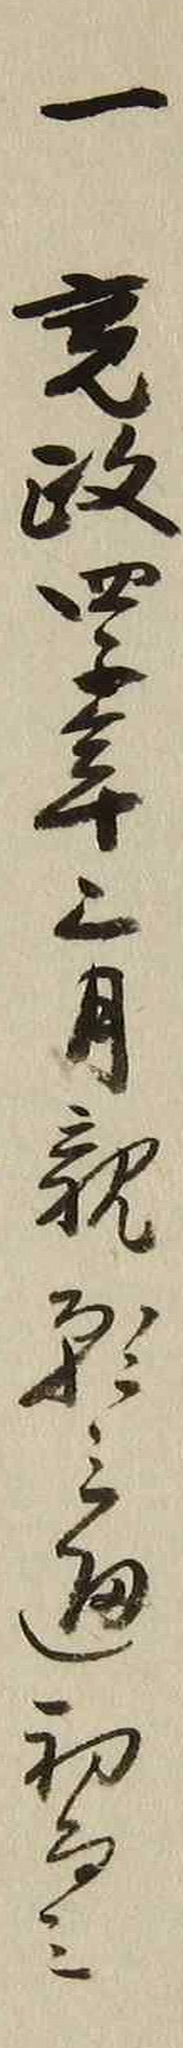一寛政四子年三月親願之通初而之
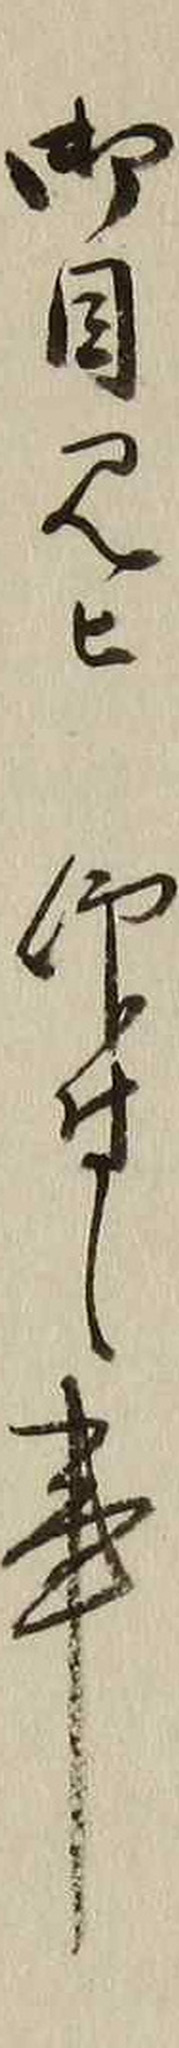御目見被仰付候事
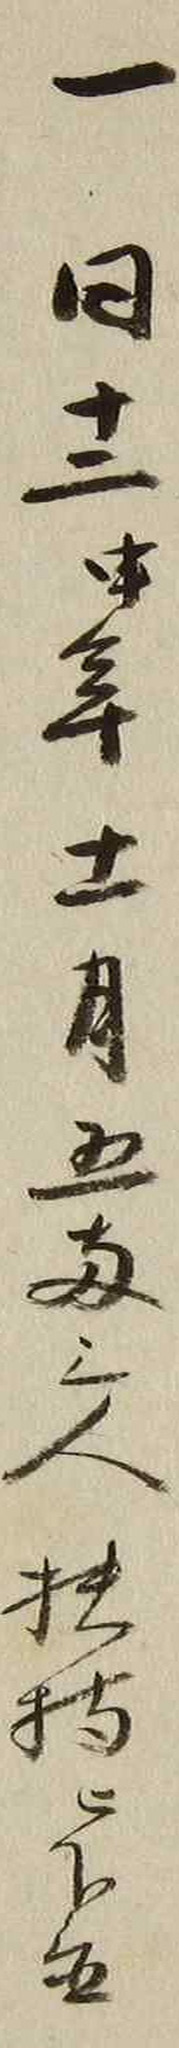一同十二申年十一月五両三人扶持被下置
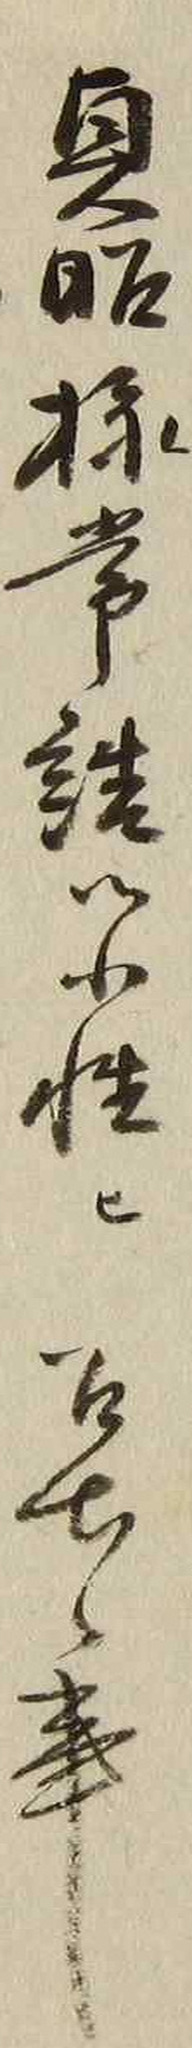貞昭様常詰御小性被召出候事
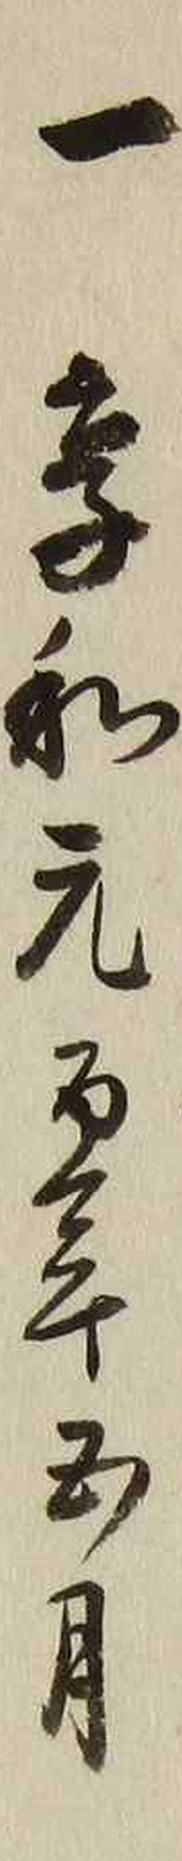一享和元酉年五月
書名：諸士系譜　巻之311　し之部1
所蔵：会津若松市立会津図書館
